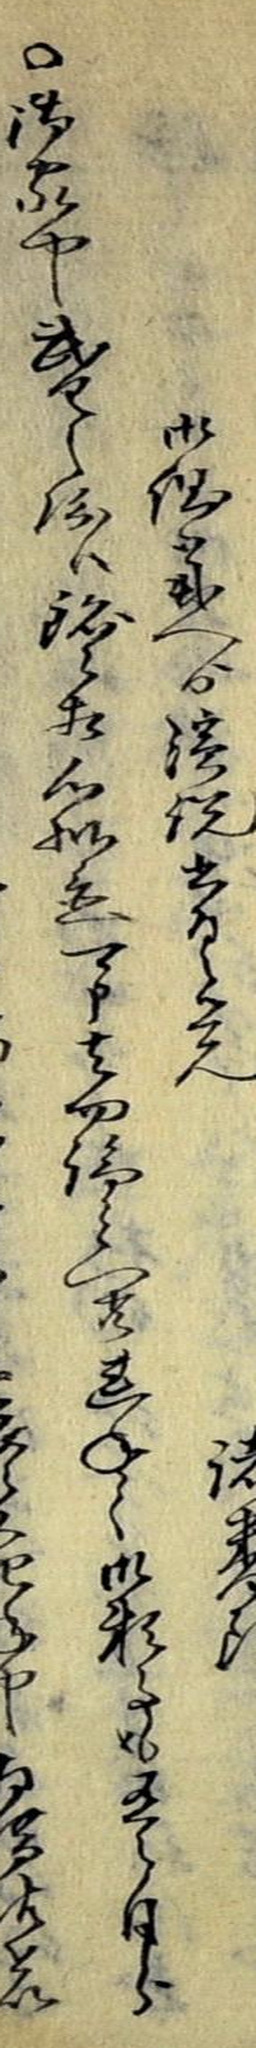○御家中武具之儀は銘々心掛置可申は勿論に候へ共連年之御頼事も有之自分
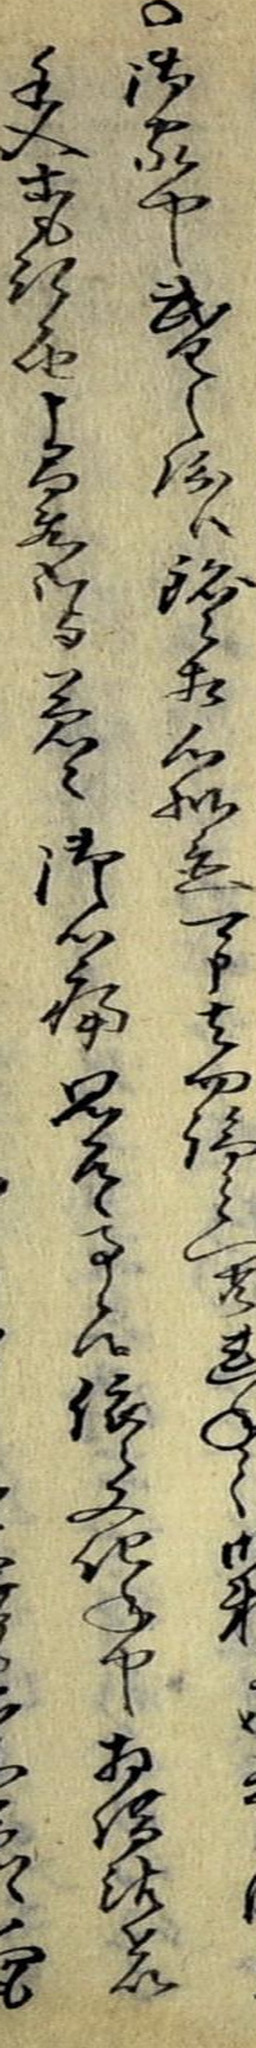手入等も行届申間敷哉と兼々御心痛思召候事に候依之文化年中拝借銀を以
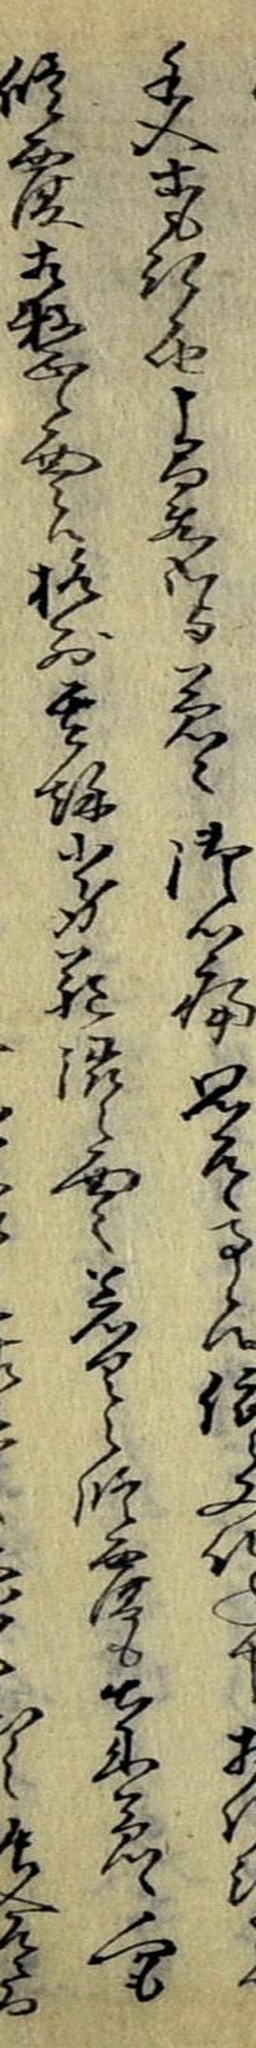修覆相整候面々は格別其餘小身難渋之面々着具之修覆も出来兼候向も
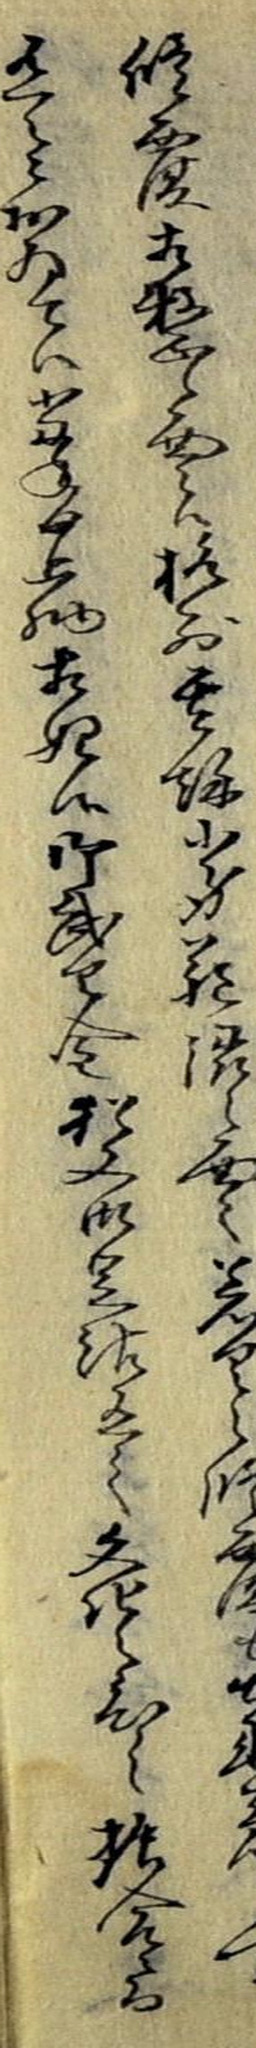有之におゐては当年ゟ上納相始候御武具金猶又御足銀有之文化度之振合に而

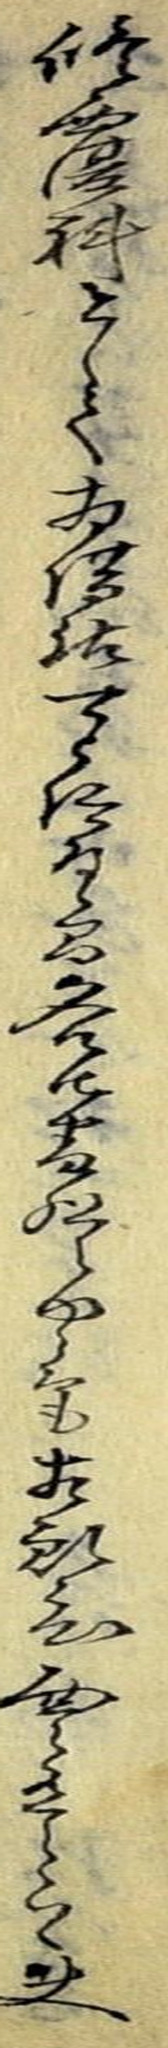修覆料として拝借銀可被仰付候間各御番組之内に而も相願度面々有之候はヽ夫
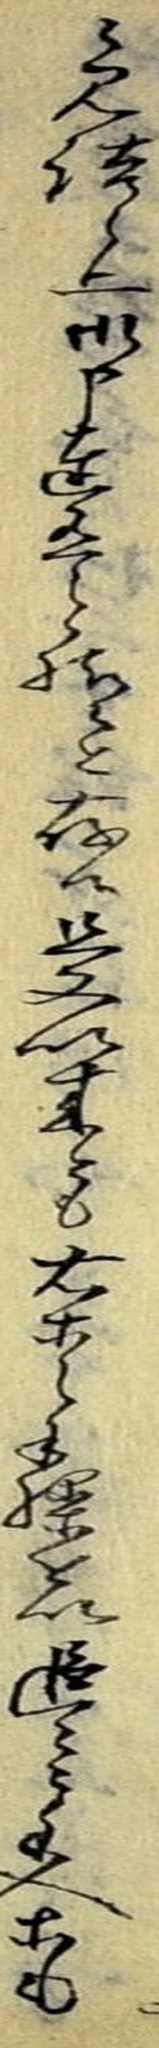々見詰之上御申達有之候樣にと存候且又以來とも右等之手繰を以追々に手入等も
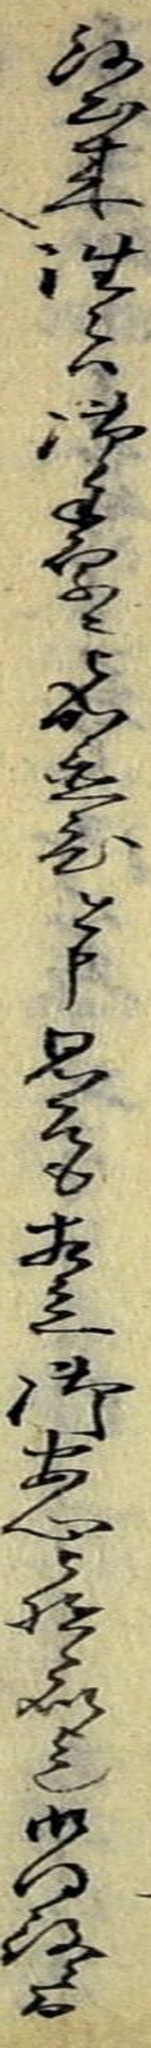致出来往々は御手当に被成置度と申思召も相立御安心被遊候処迄御同役に而
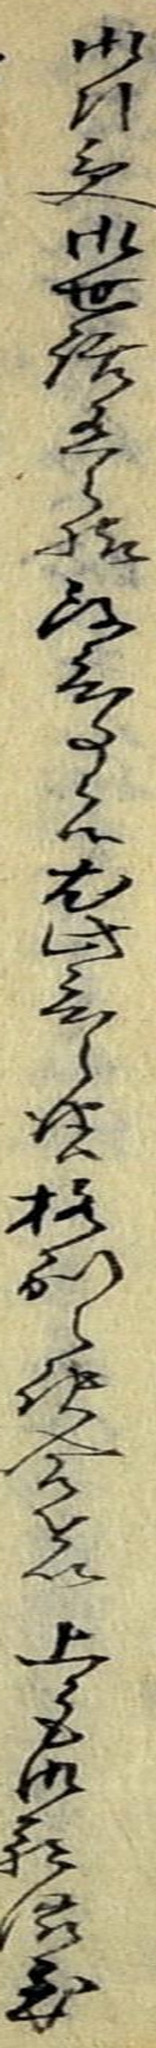御引受御世話有之様致度事に候尤此度之儀は格別之訳合を以上にも御難渋至
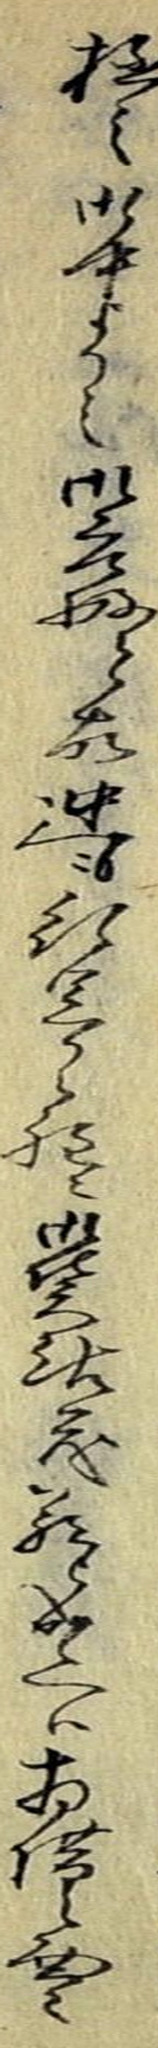極之御中より之御取扱候故迚も行足候程之御貸銀も難被成候へは拝借之面々
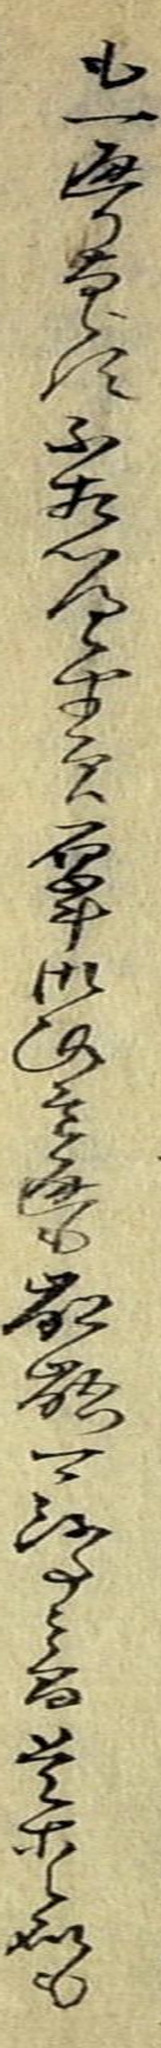も一通りならす不相心得之半而は厚キ御趣意通も啓発可致候間是等之処も
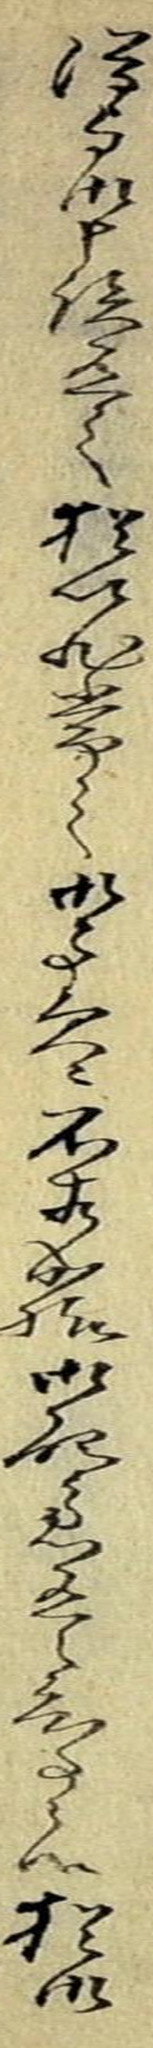得と御申談有之猶以非常之御事欠に不相成様御配慮有之度事に候猶御
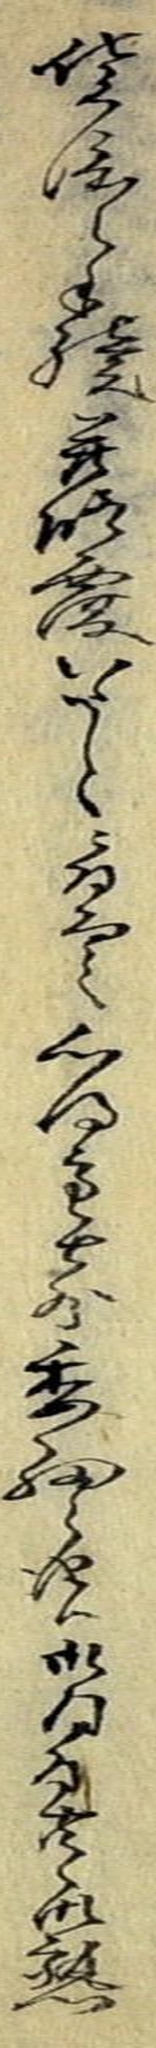貸渡之手続并修覆いたしに付而之心得方其外委細之儀は御目付共へ御熟
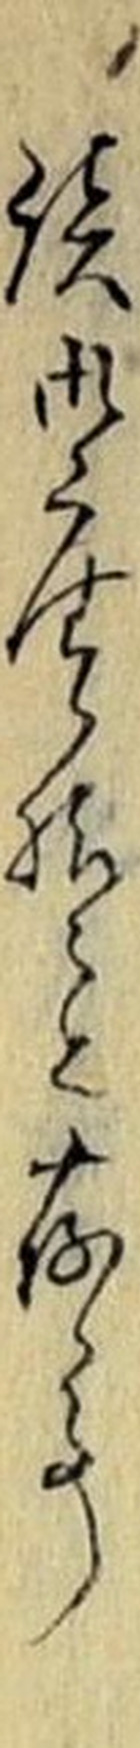談御座候様にと存候事
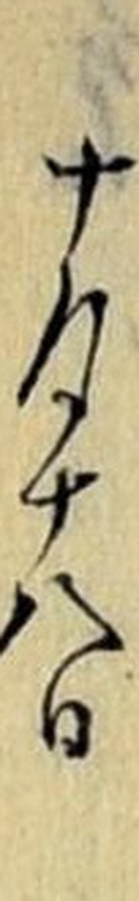十月十八日
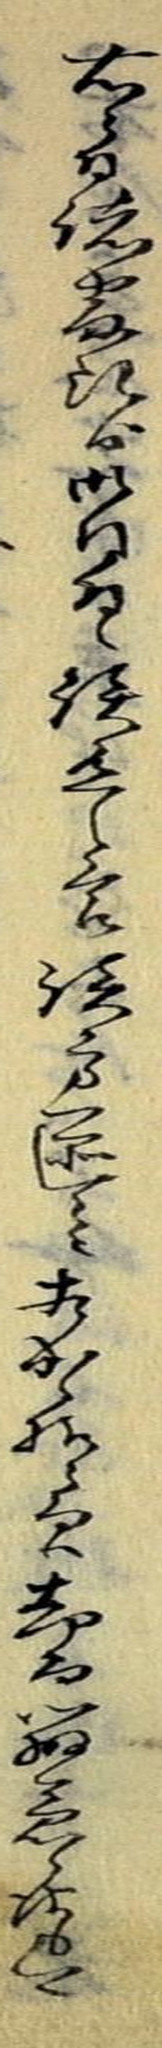右弐付諸番頭ゟ御目付へ談有之節談方區々に相成候様に而は却而弁兼候儀も可
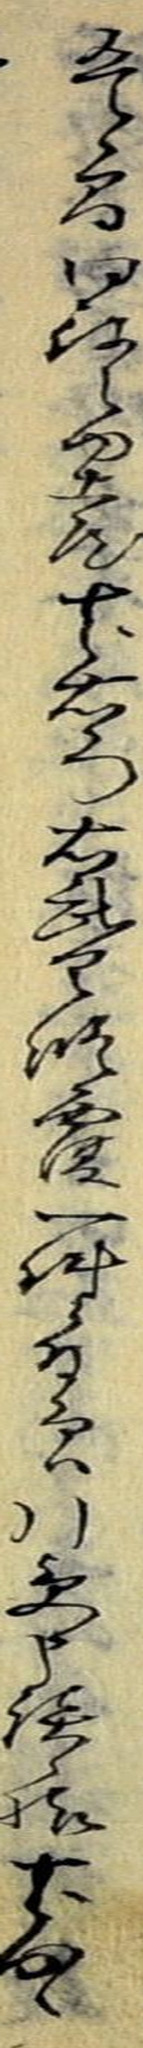有之候間同役之内土屋十郎右衛門右武具修覆一件に付而は引受申談候樣十郎右衛門へ
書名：命令之部 六
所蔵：福井県文書館 Fukui Prefectural Archives
